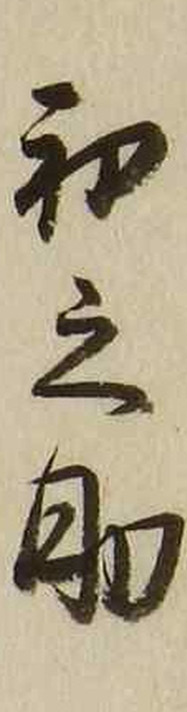初之助
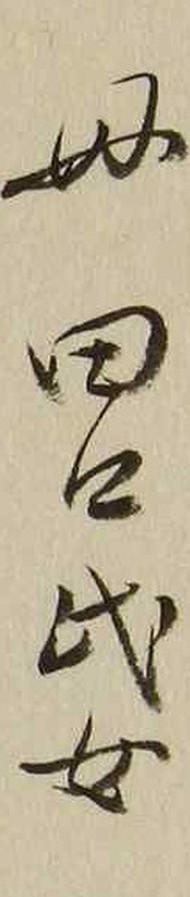母田口氏女
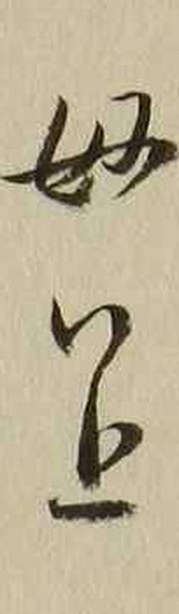母同上
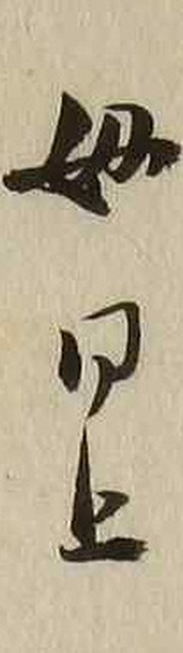母同上
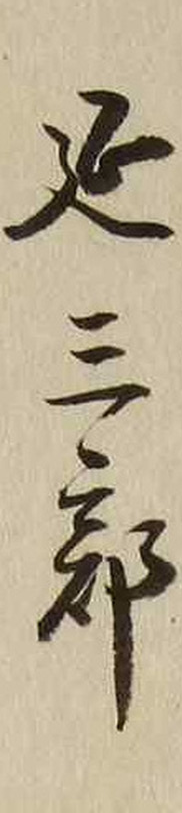延三郎
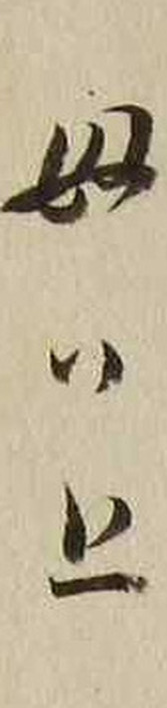母同上
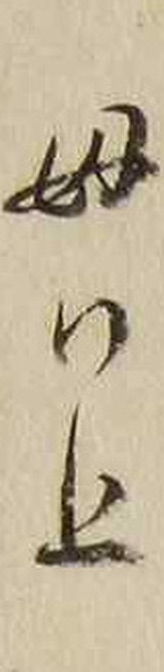母同上

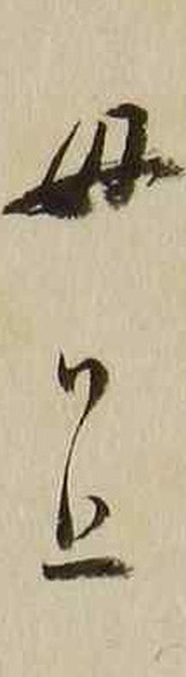母同上
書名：諸士系譜　巻之288　さ之部20
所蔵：会津若松市立会津図書館
